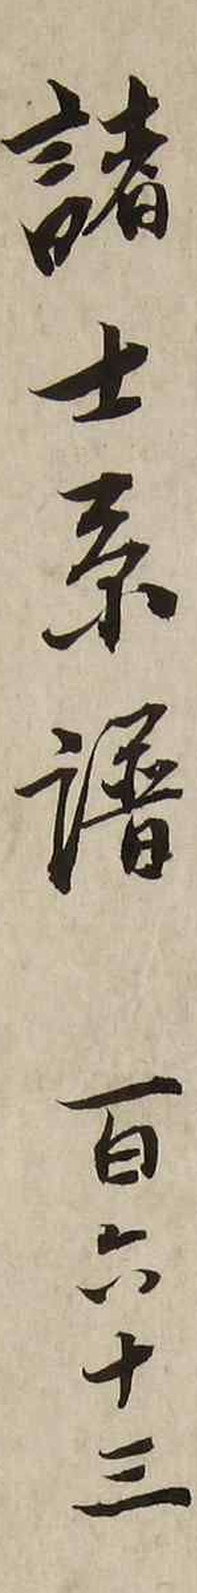諸氏系譜百六十三

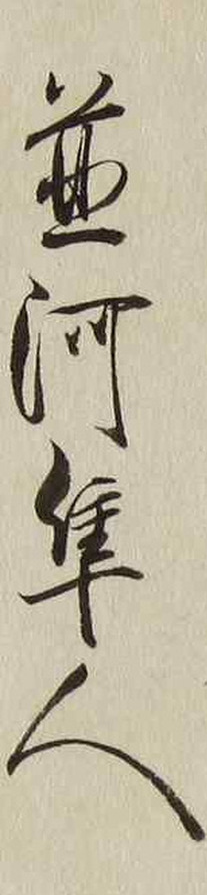並河隼人

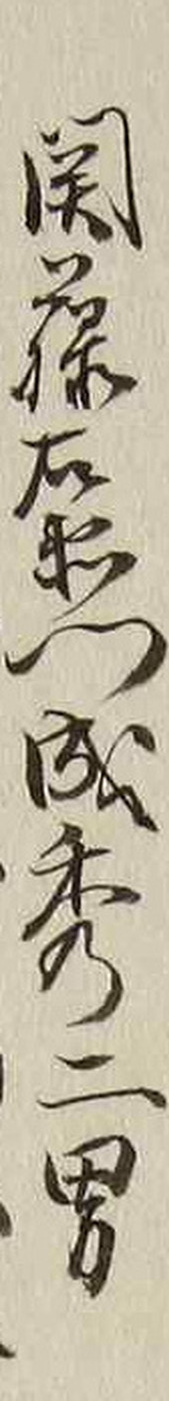関藤右衛門成秀二男
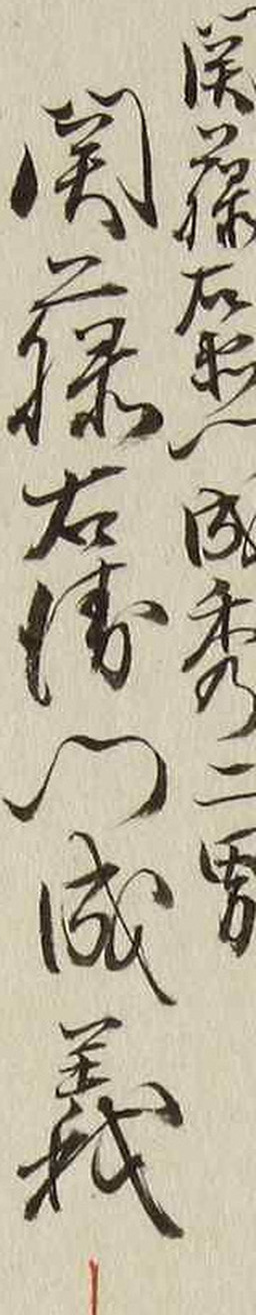関藤右衛門成義
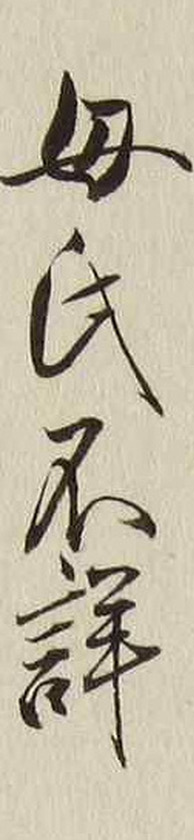母氏不詳
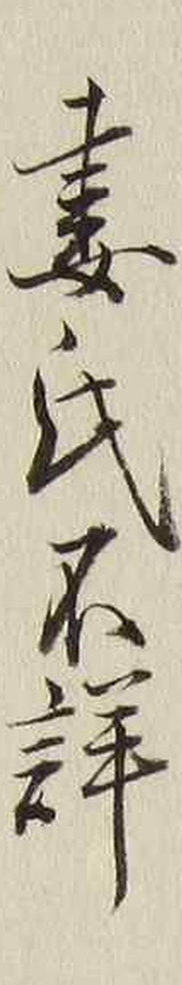母氏不詳
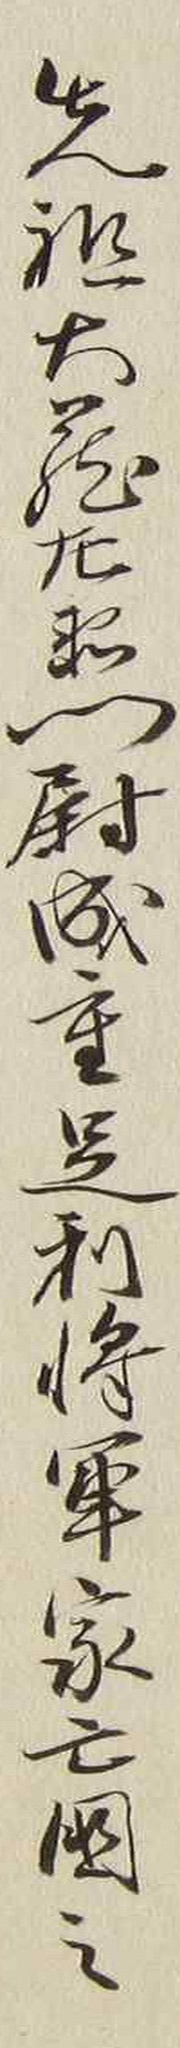先祖大蔵左衛門尉成重足利将軍家亡国之
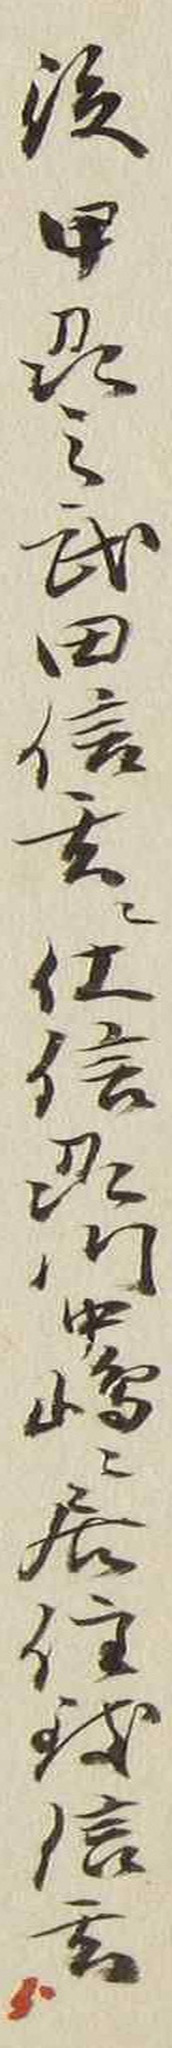後甲州之武田信玄ニ仕信州川中嶋ニ居住致信玄

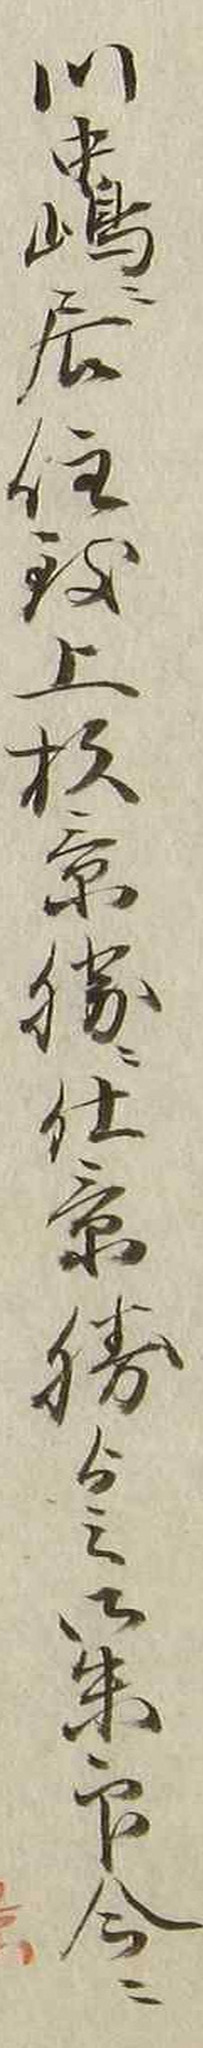川中嶋ニ居住致上杉景勝ニ仕景勝ゟ之御朱印今ニ
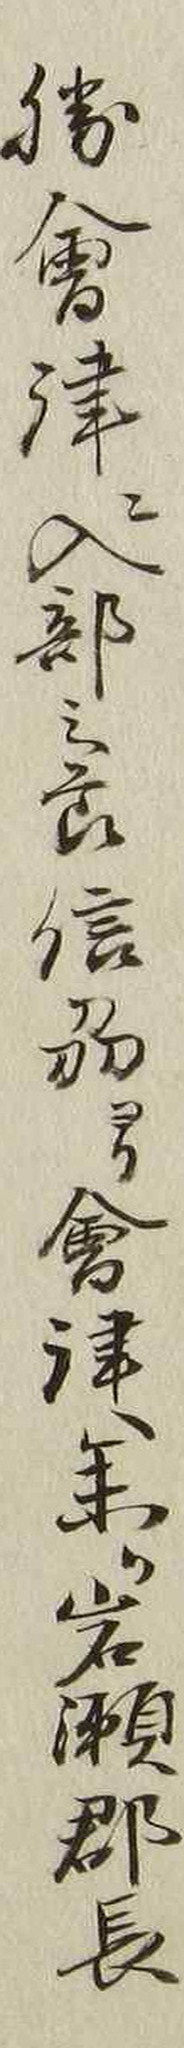勝会津ニ入部之節信州ゟ会津ㇸ参ㇼ岩瀬郡長
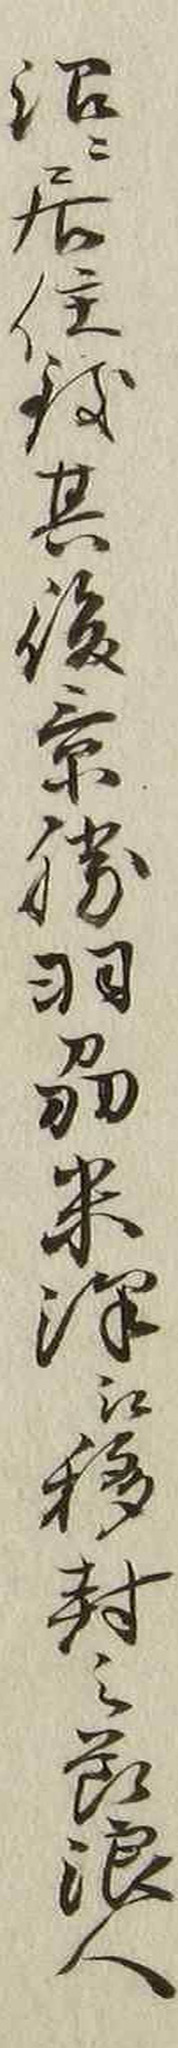沼ニ居住致其後景勝羽州米沢え移封之節浪人
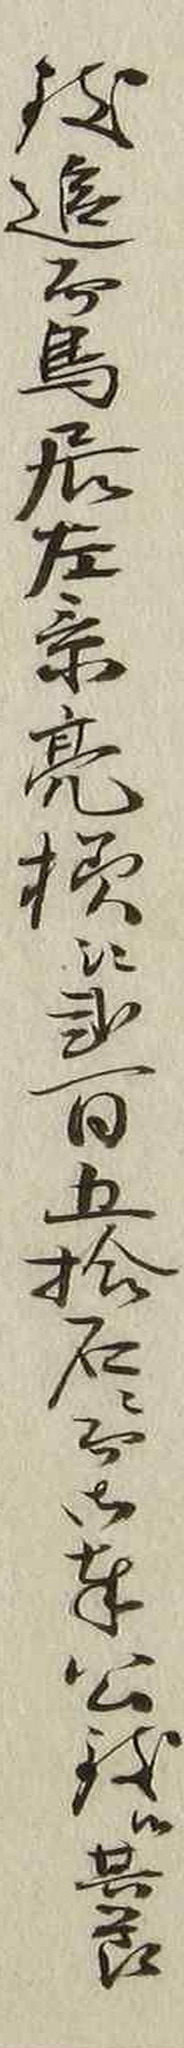致追而鳥居左景亮様え弐百五拾石ニ而御奉公致候其節
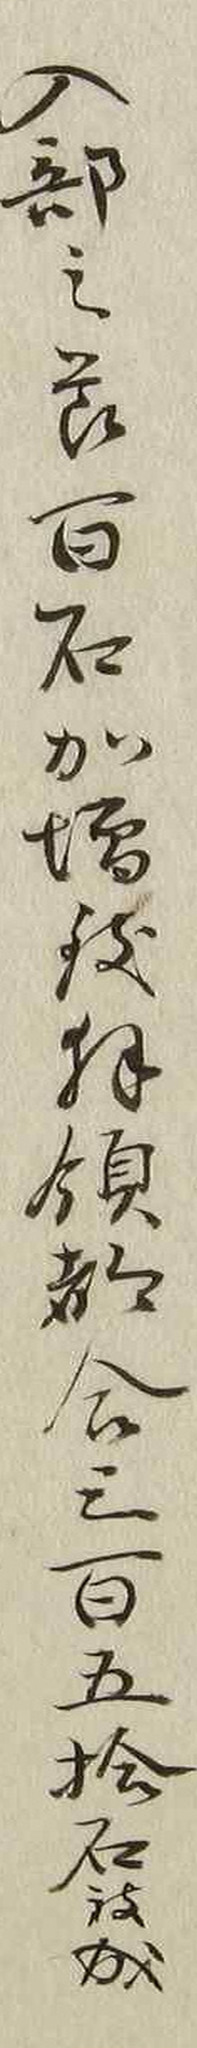入部之節百石加増致拝領都合三百五拾石被成
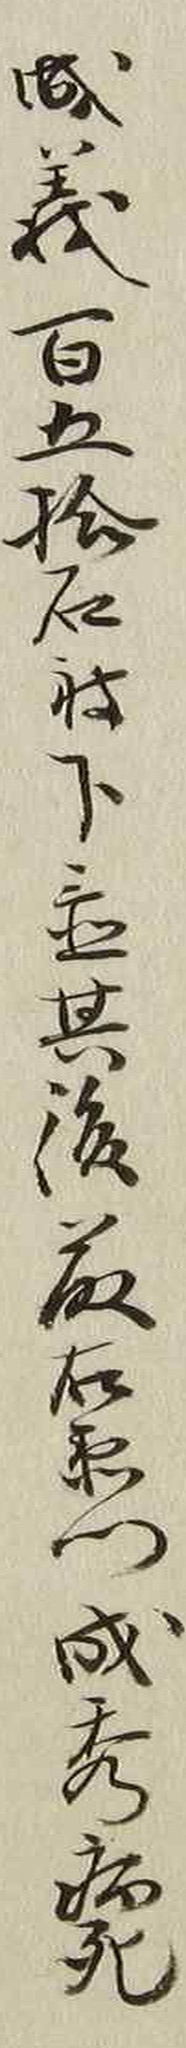成義百五拾石被下置其後藤右衛門成秀病死
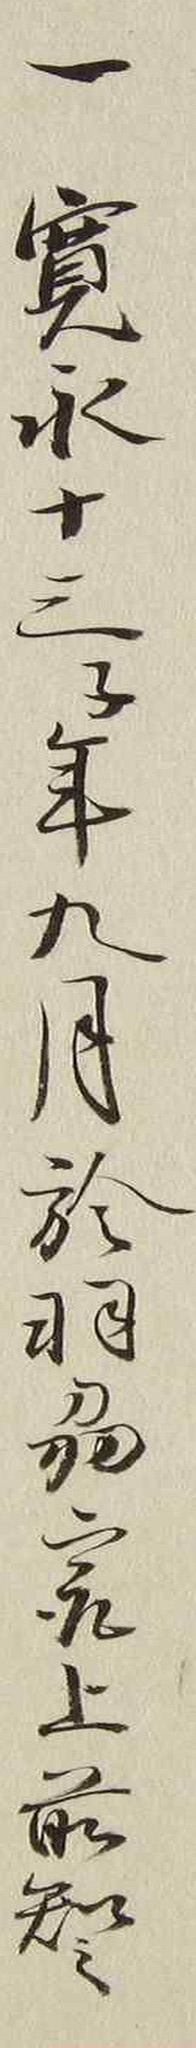一寛永十三子年九月於羽州最上前知之
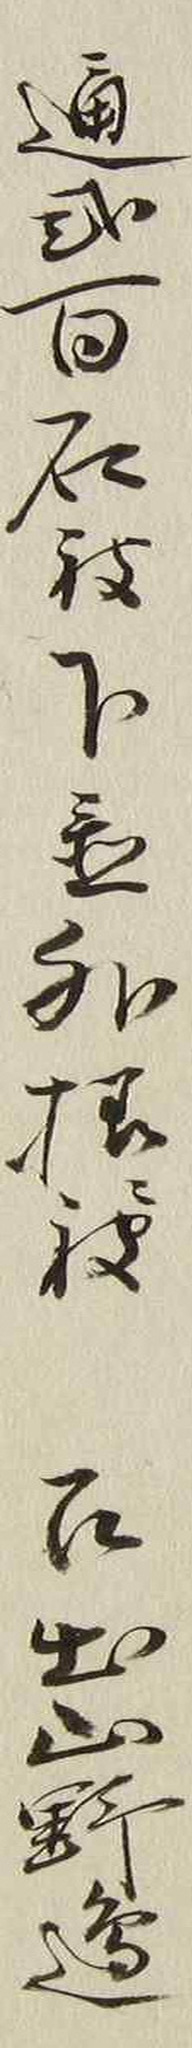通弐百石被下置外様ニ被召出山野辺
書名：諸士系譜　巻之163　な之部5
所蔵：会津若松市立会津図書館
